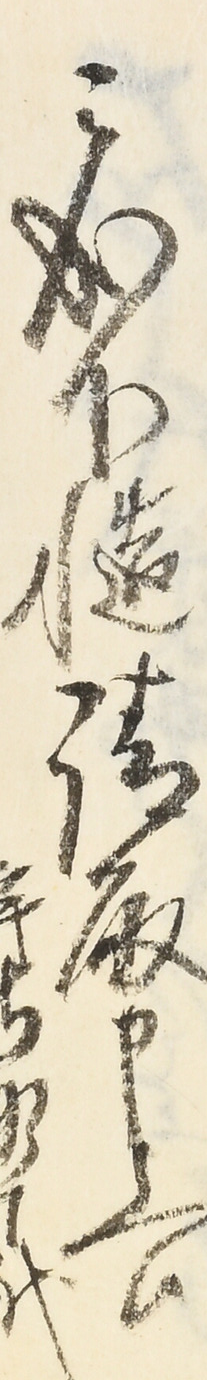立成下慥請取申上候
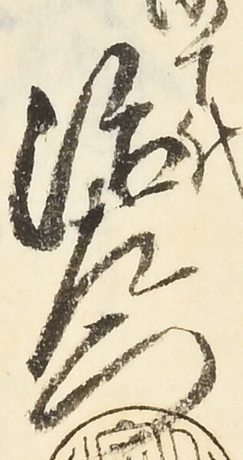久左衛門

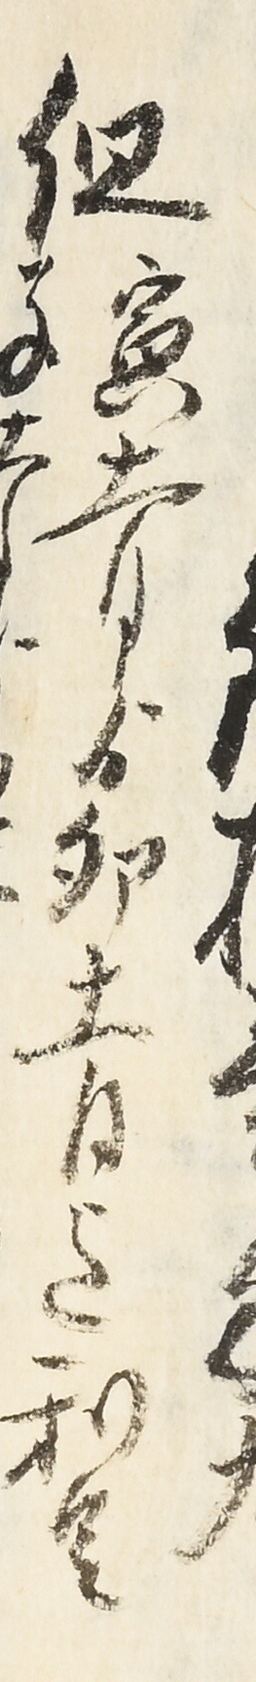但寅十一月ゟ卯十一月迄利足
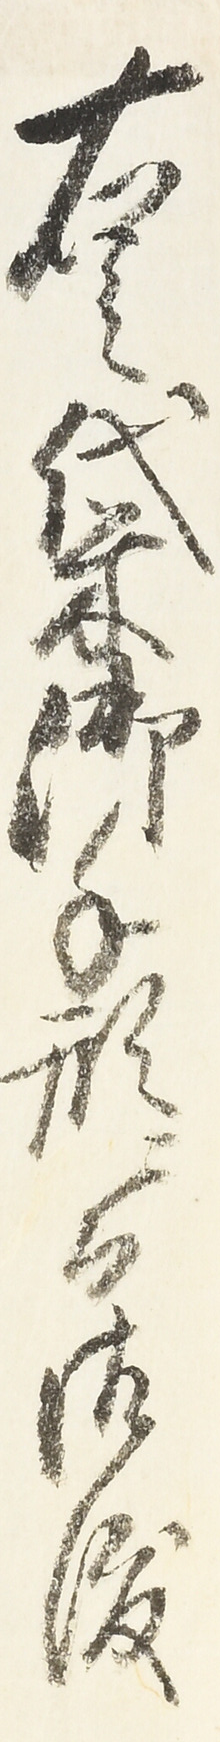右之代米御手形ニ而御渡
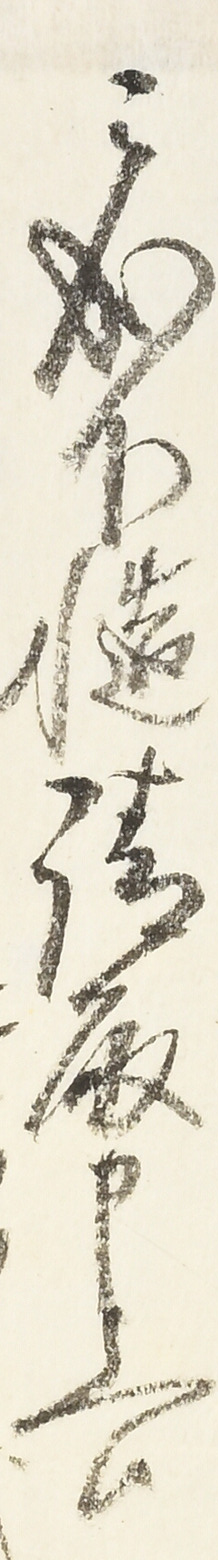被成下慥請取申上候
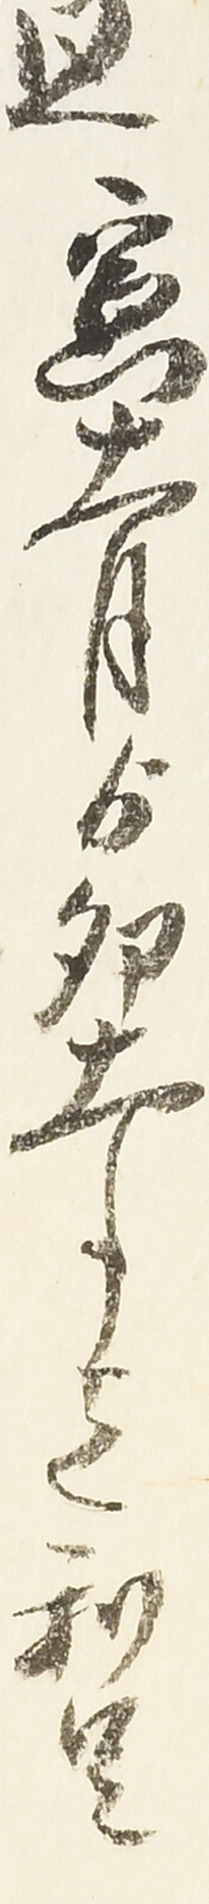但寅十一月ゟ卯十一月迄利足
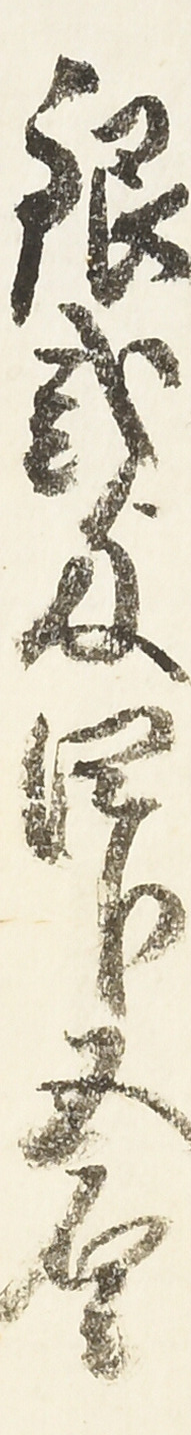銀弐匁四分五厘
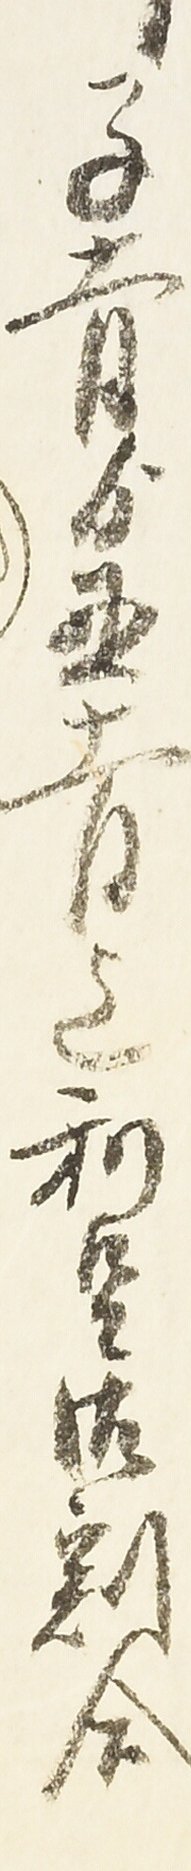子十一月ゟ丑十一月迄利足御割合
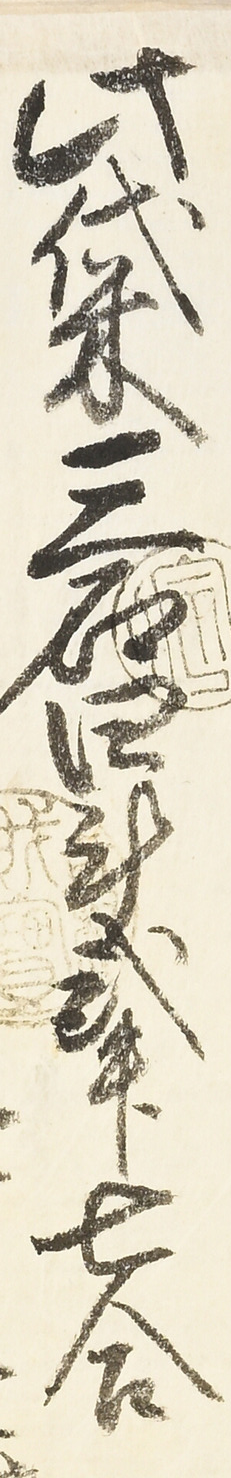此代米三石四斗弐升七合
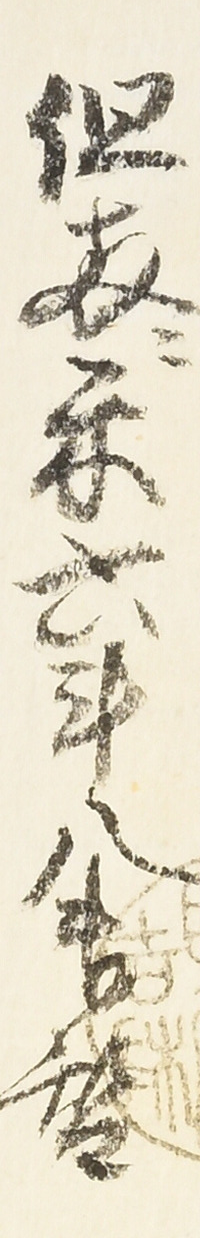但両ニ米六斗八升替
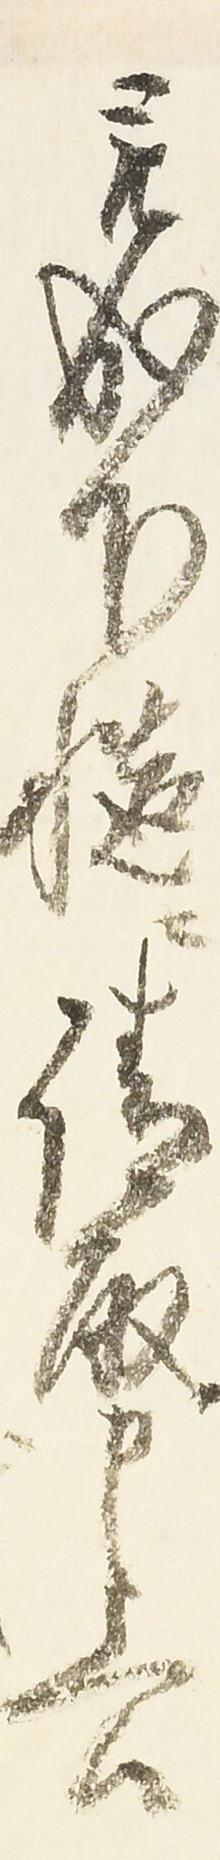被成下慥請取申上候
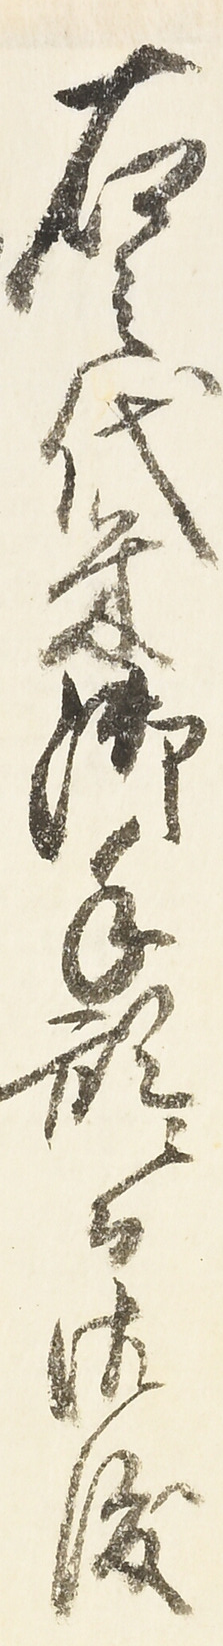右之代米御手形ニ而御渡
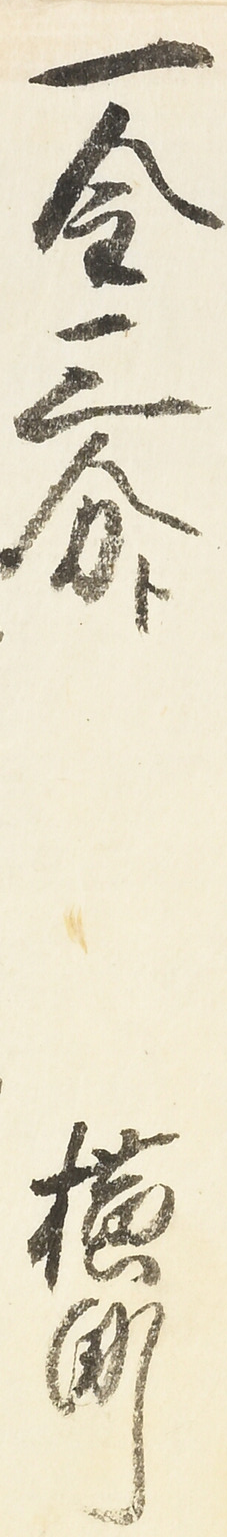一金三分ト新町
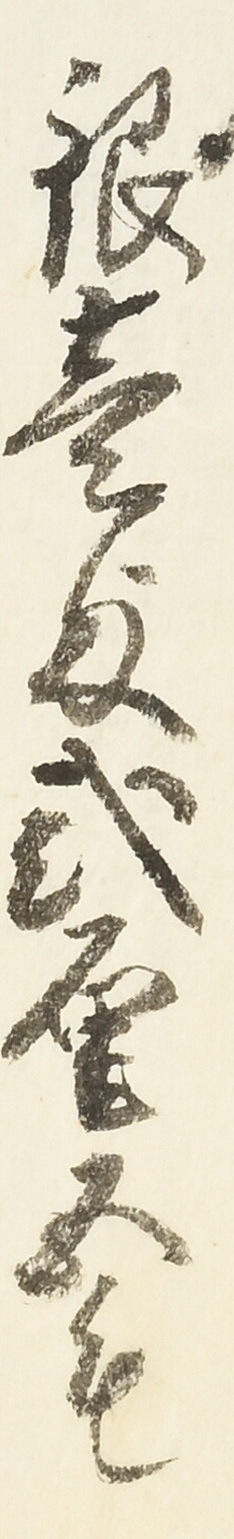銀壱匁弐厘五毛
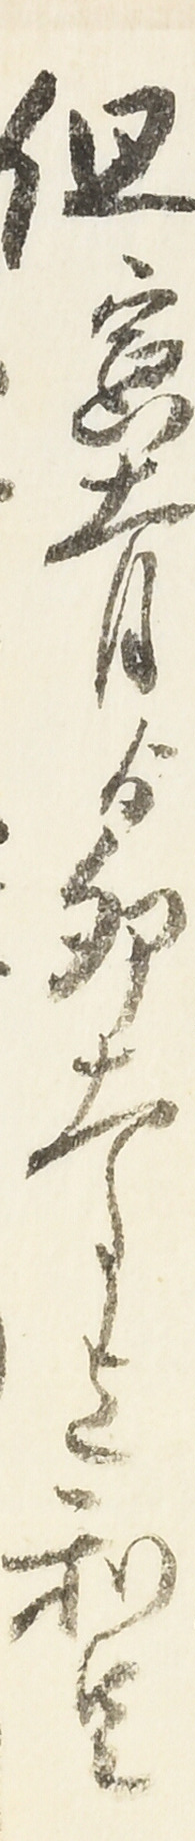但寅十一月ゟ卯十一月迄利足
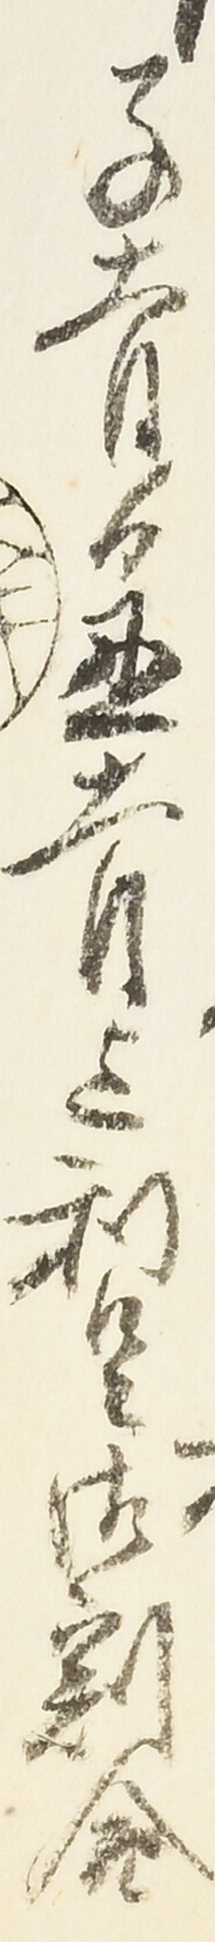子十一月ゟ丑十一月迄利足御割合
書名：御才覚金御利足割渡扣帳
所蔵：伊那市立高遠町図書館・合同会社AMANE
